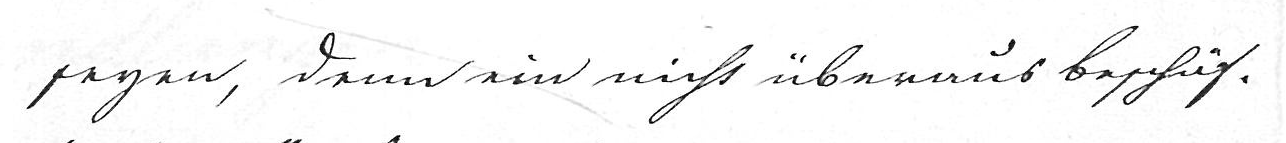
seyen, denn ein nicht überaus beschäf-
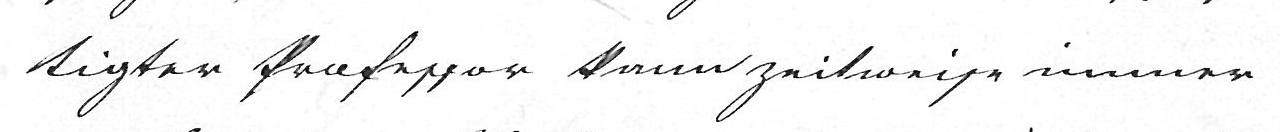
tigter Professor kann zeitweise immer
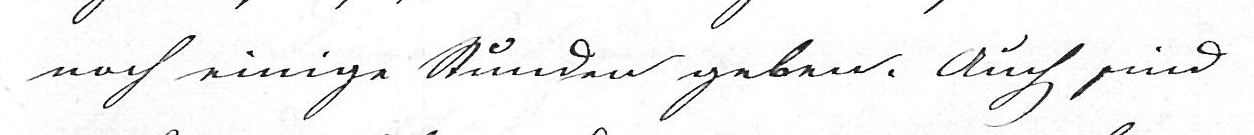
noch einiges Stunden geben. Auch sind
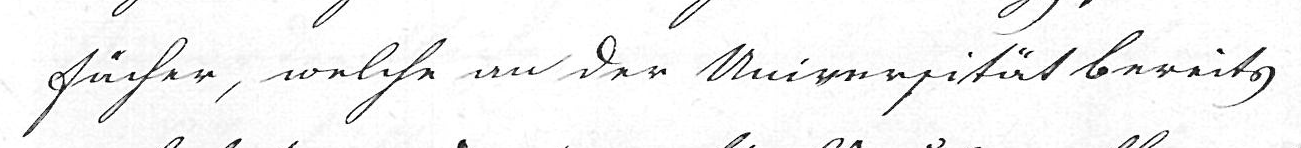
Fächer, welche an der Universität bereits
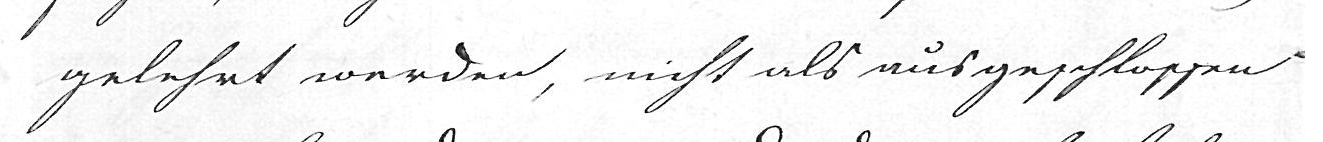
gelehrt werden, nicht als ausgeschlossen
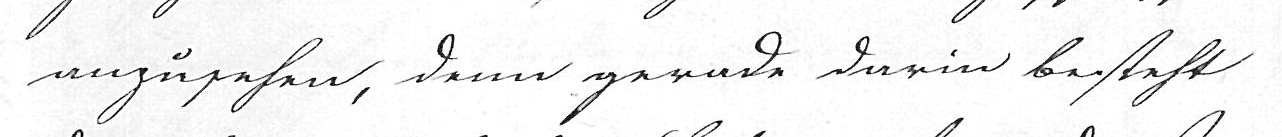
anzusehen, denn gerade darin besteht
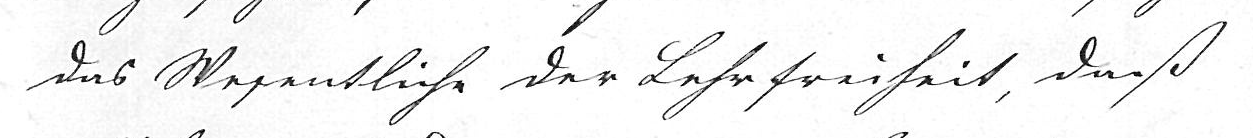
das Wesentliche der Lehrfreiheit, daß
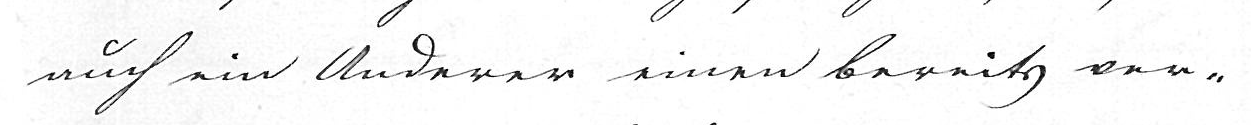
auch ein Anderer einen bereits ver-
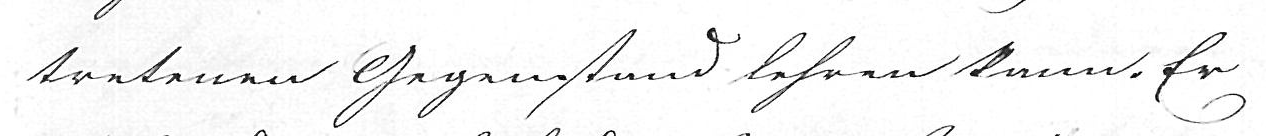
tretenen Gegenstand lehren kann. Er
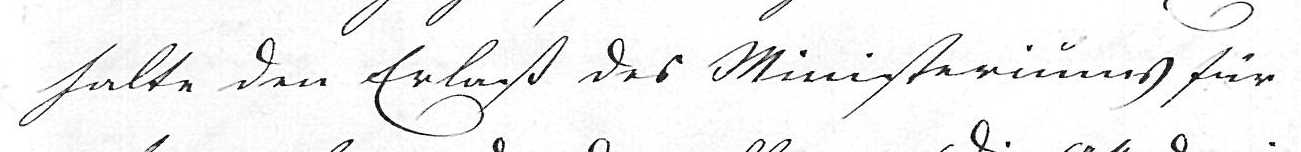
halte den Erlaß des Ministeriums für
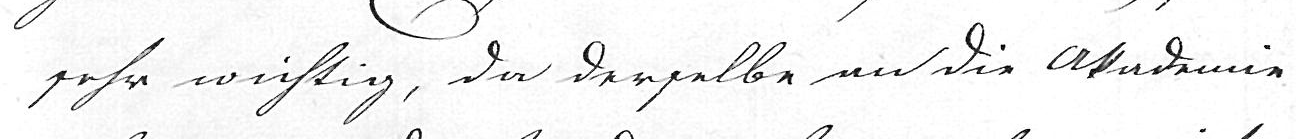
sehr wichtig, da derselbe an die Akademie
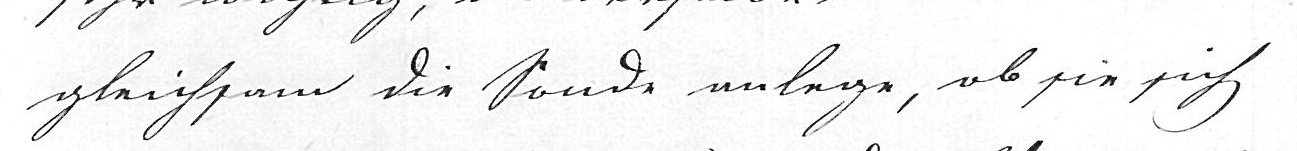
gleichsam die Sonde anlege, ob sie sich
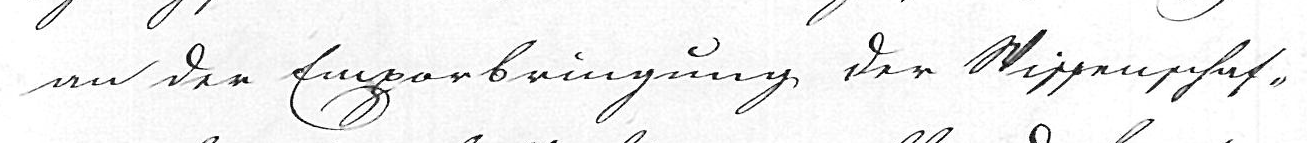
an der Emporbringung der Wissenschaf-
